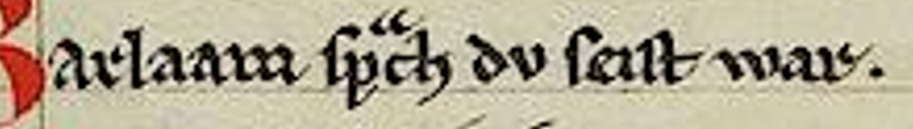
**Barlaam ſp(ra)ch dv ſeiſt war.
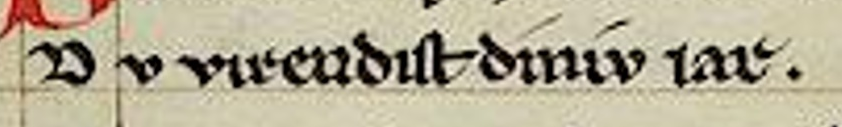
Dv virendiſt diniv iar.
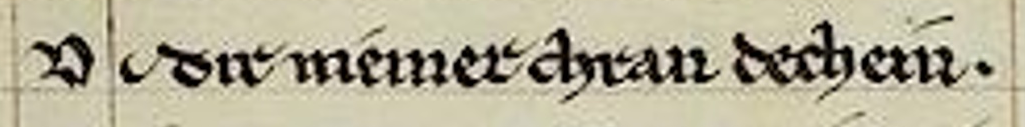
D(az) dir niemer chran dechein.
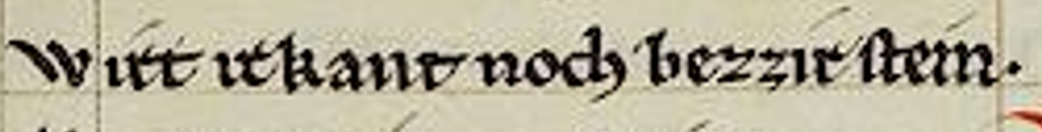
Wirt irkant noch bezzir ſtein.
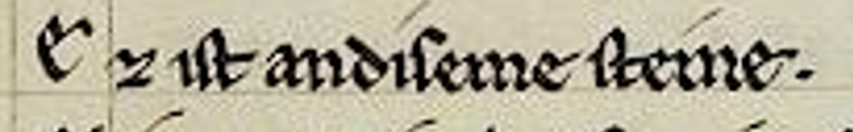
Ez iſt andiſeme ſteine.
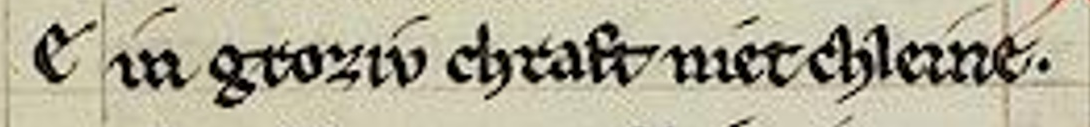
Ein groziv chraft niet chleine.
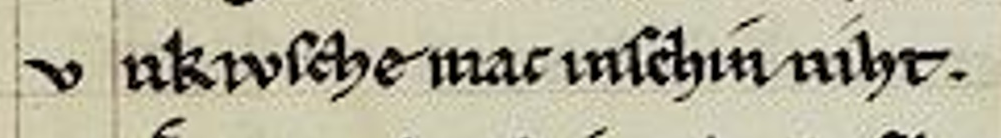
Vnkivſche mac inſehin niht.
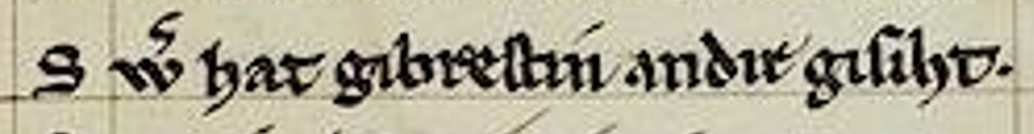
Sw(er) hat gibreſtin andir geſiht.
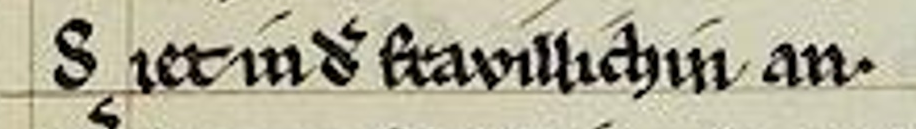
Siet in d(er) fravillichin an.
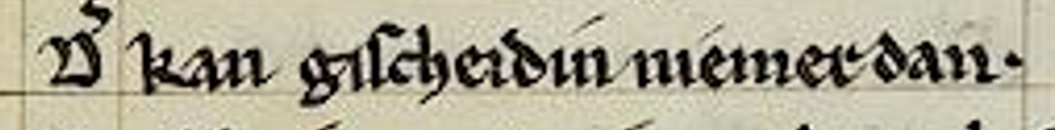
D(er) kan giſcheidin niemer dan.
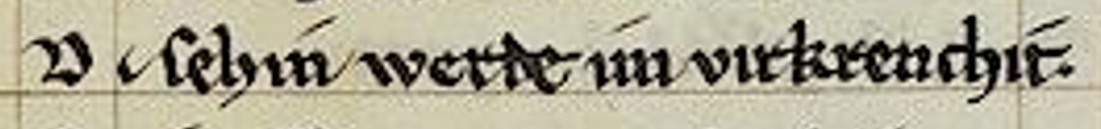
D(az) ſehin werde im virkrenchit.
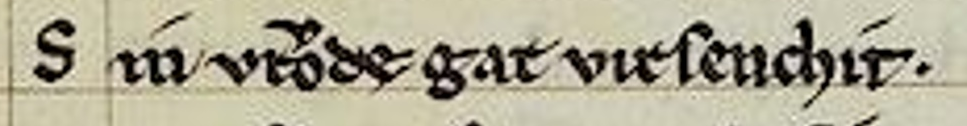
Sin vro°vde gar virſenchit.
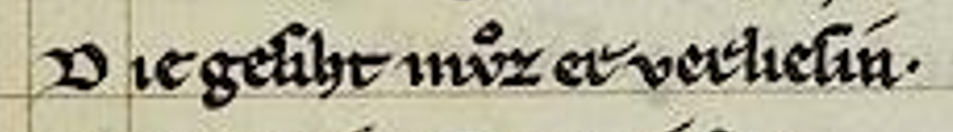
Die geſiht mv°oz er verlieſin.
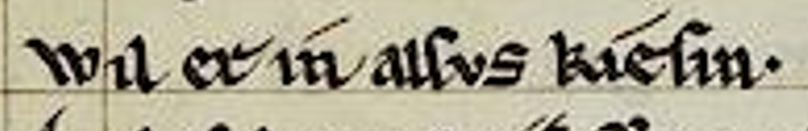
Wil er in alſus kieſin.
